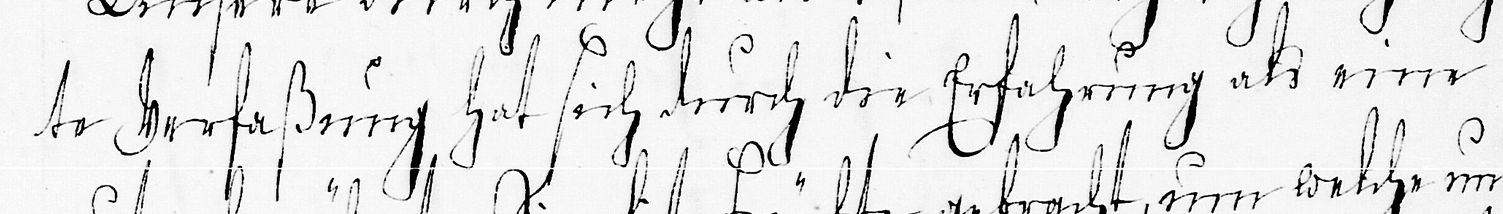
te Verfaßung hat sich durch die Erfahrung als eine
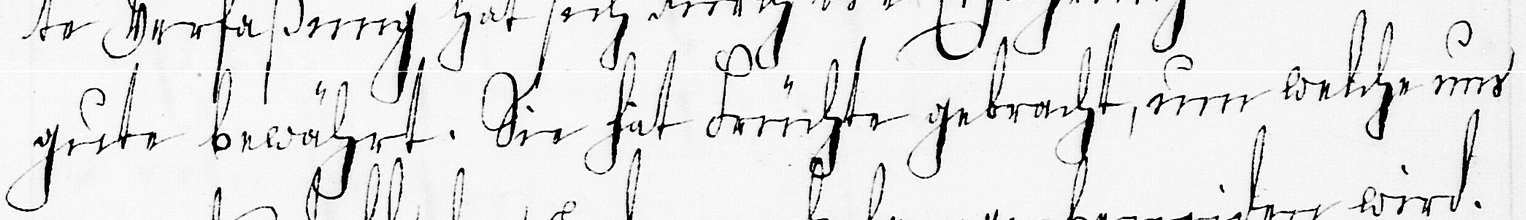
gute bewährt. Sie hat Früchte gebracht, um welche uns
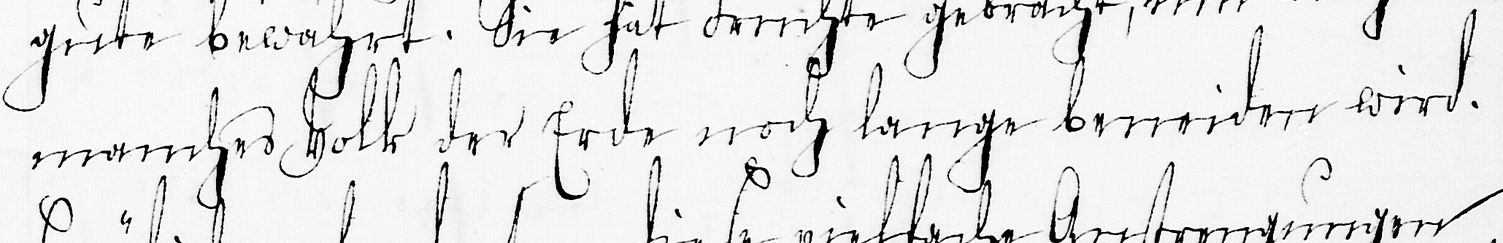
manches Volk der Erde noch lange beneiden wird.
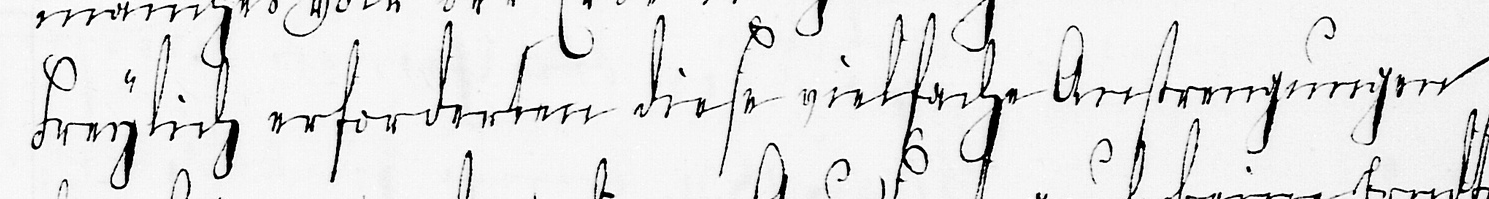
Freylich erforderten diese vielfache Anstrengungen
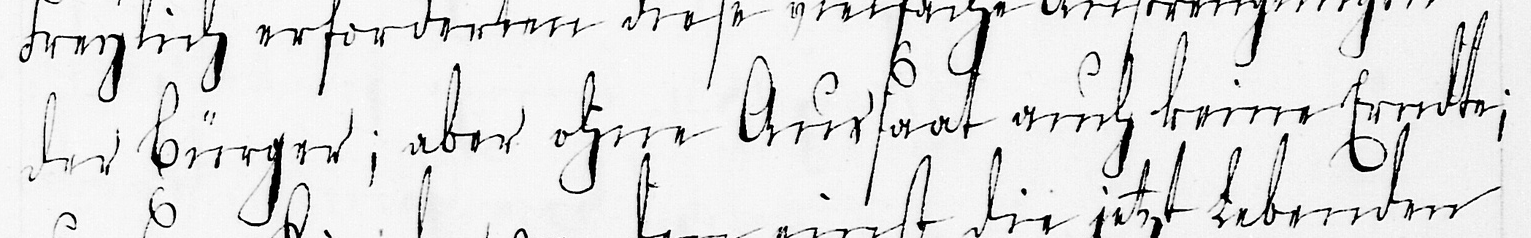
der Bürger; aber ohne Aussaat auch keine Erndte;
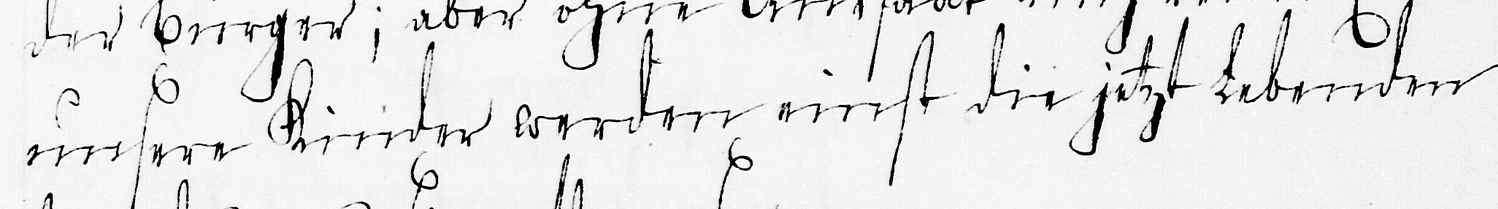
unsere Kinder werden einst die jetzt Lebenden
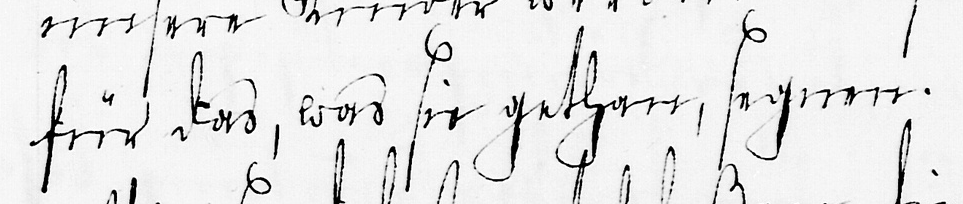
für das, was sie gethan, segnen.
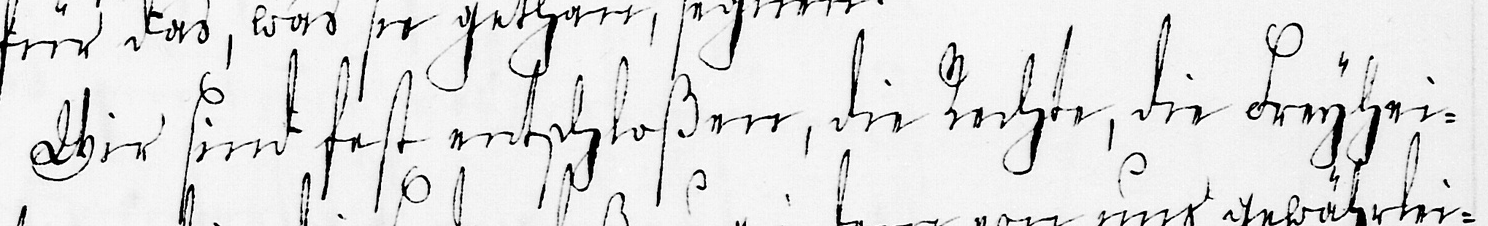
Wir sind fest entschloßen, die Rechte, die Freyhei¬
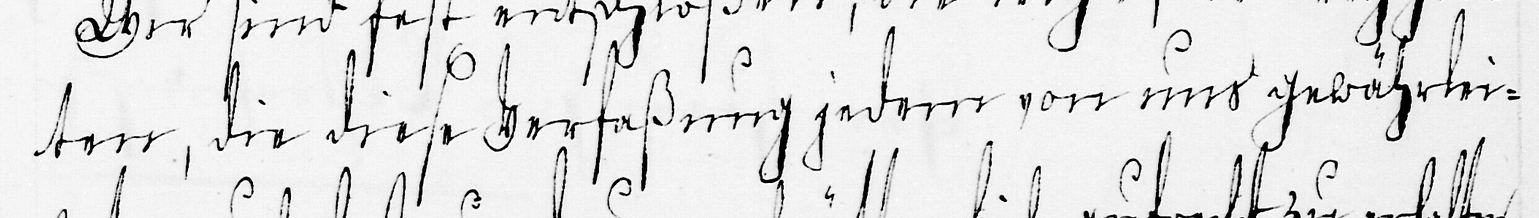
ten, die diese Verfaßung jedem von uns gewährleis¬
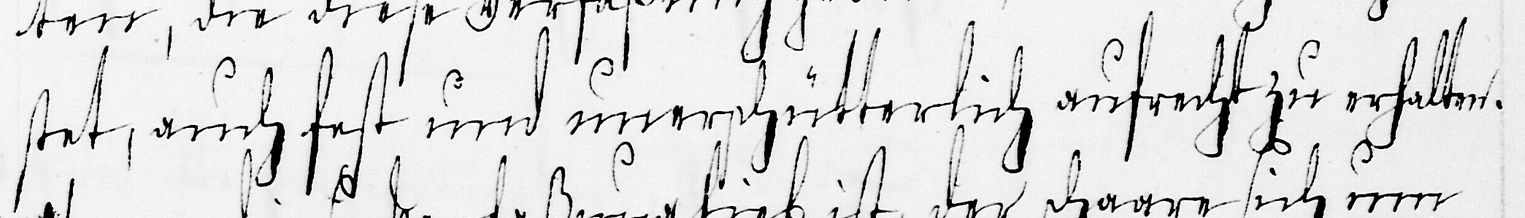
tet, auch fest und unerschütterlich aufrecht zu erhalte¬
